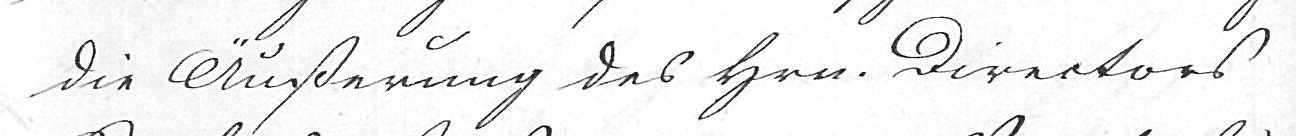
die Äußerung des Hrn. Directors
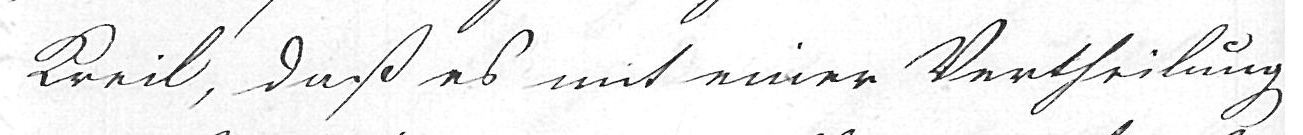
Kreil, daß es mit einer Vertheilung
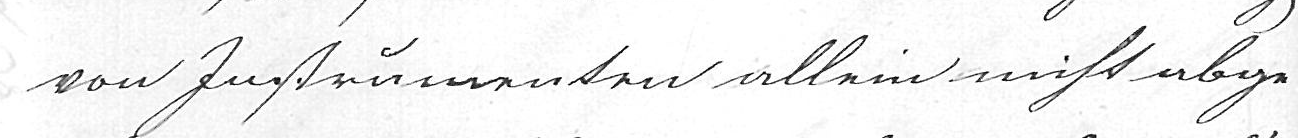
von Inftrumenten allein nicht abge-
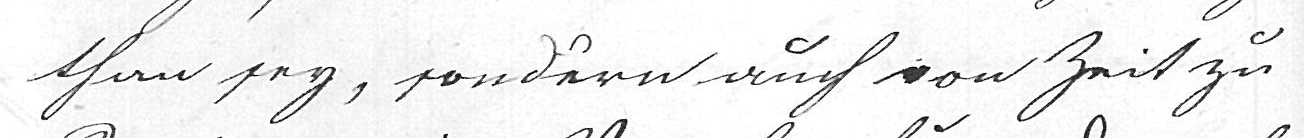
than sey, sondern auch von Zeit zu
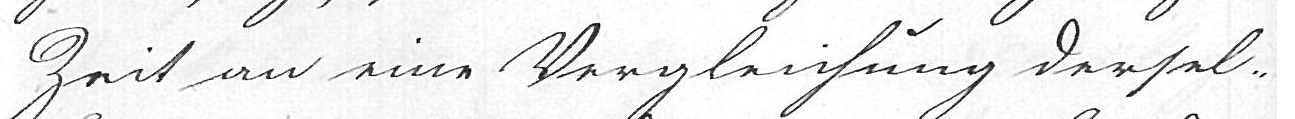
Zeit an eine Vergleichung dersel-
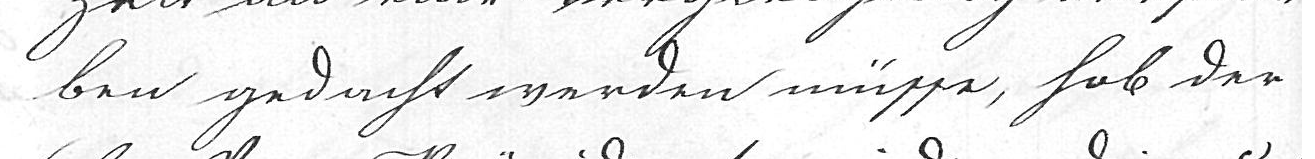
ben gedacht werden müsse, hob der
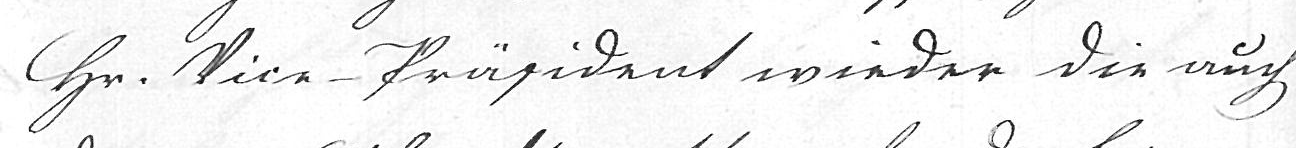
Hr. Vice-Präsident wieder die auch
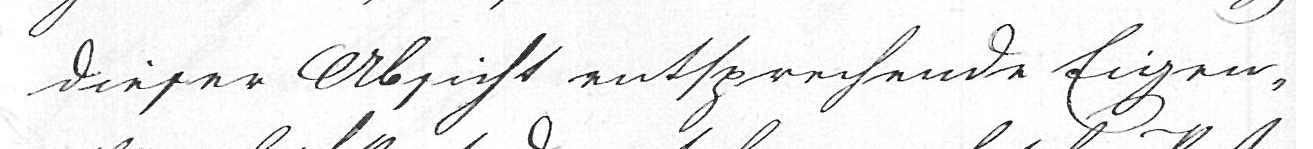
dieser Absicht entsprechende Eigen-
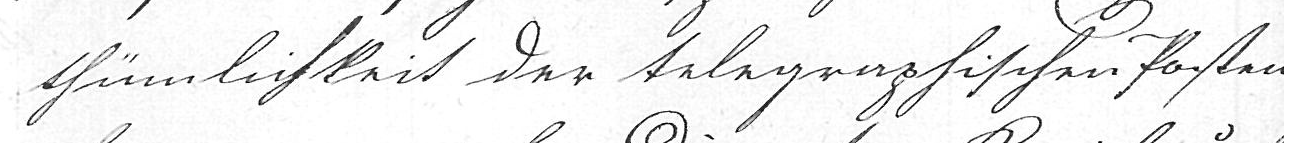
thümlichkeit der telegraphischen Posten
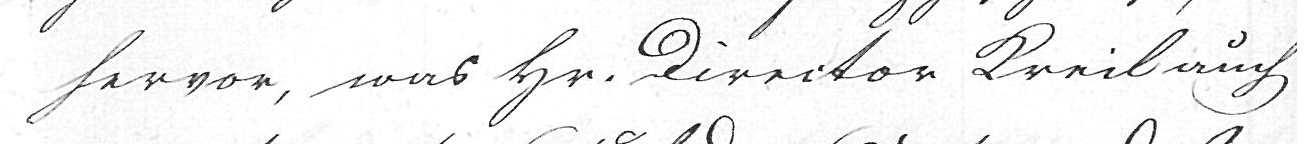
hervor, was Hr. Director Kreil auch
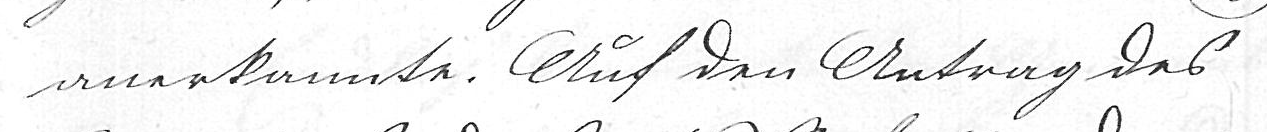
anerkannte. Auf der Antrag des
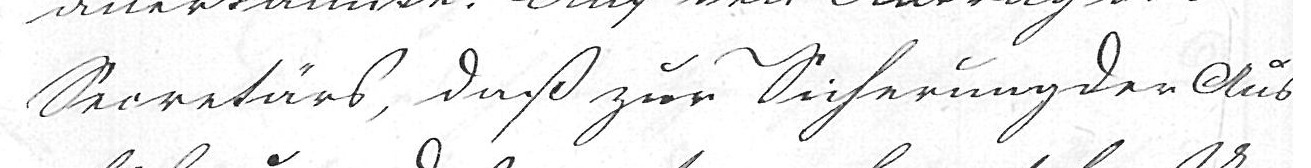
Secretärs, daß zur Sicherung der Aus-
